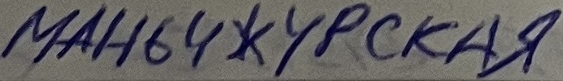маньчжурская
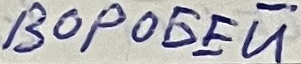воробей
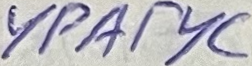урагус
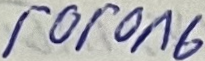гоголь
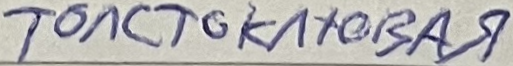толстоклювая
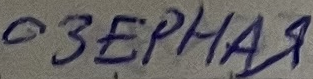озерная
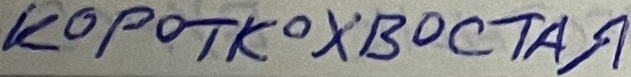короткохвостая
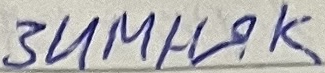зимняк
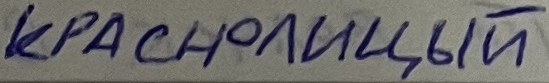краснолицый
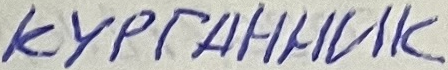курганник
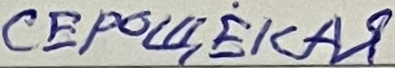серощекая
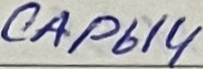сарыч
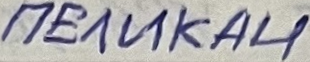пеликан
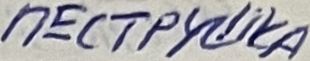пеструшка
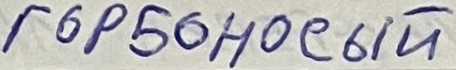горбоносый
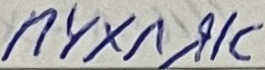пухляк
